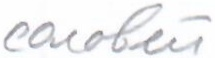соловей
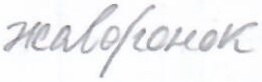жаворонок
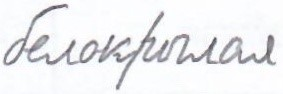белокрылая
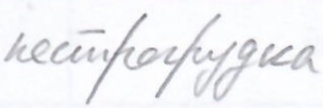пестрогрудка
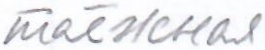таёжная
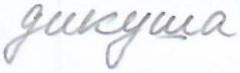дикуша
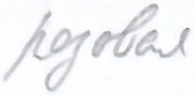розовая
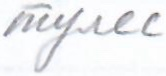тулес
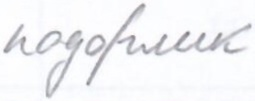подорлик
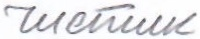чистик
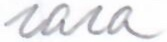гага
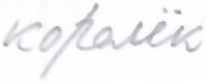королёк
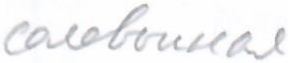соловьиная
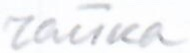чайка
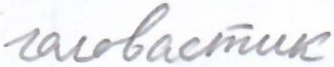головастик
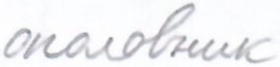ополовник
